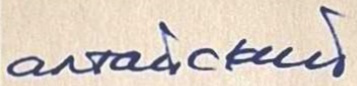алтайский
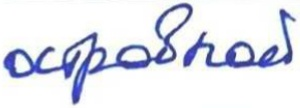островной
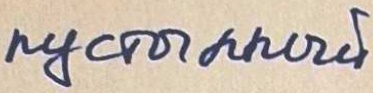пустынный
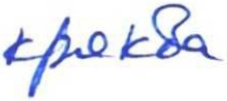кряква
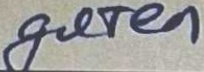дятел
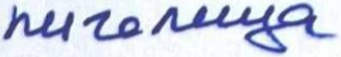пиголица
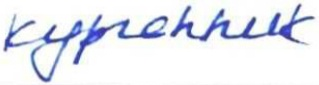кургенник
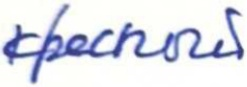красный
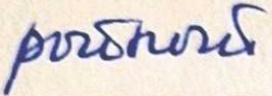рыбный
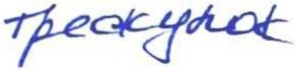трескунок
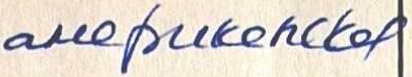америкенскоя
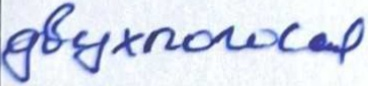двухполосая
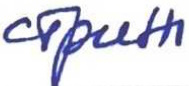стриж
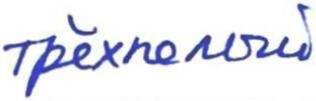трёхпелый
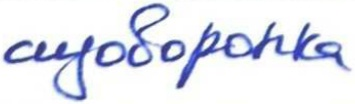сизоворонка
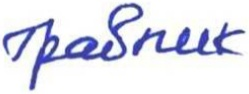травник
